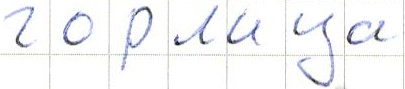горлица
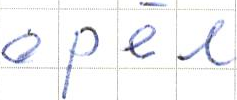орёл
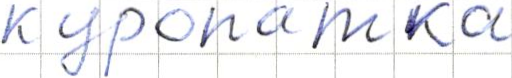куропатка
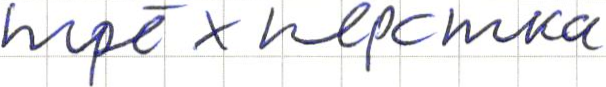трёхперстка
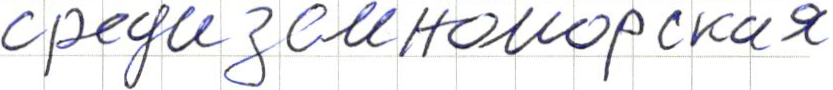средиземноморская
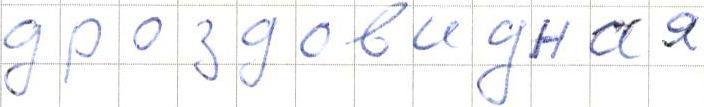дроздовидная
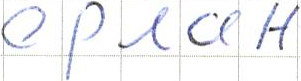орлан
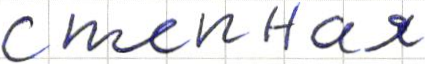степная
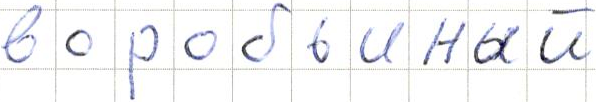воробьиный
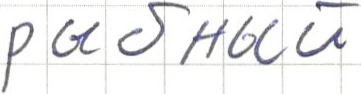рыбный
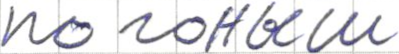погоныш
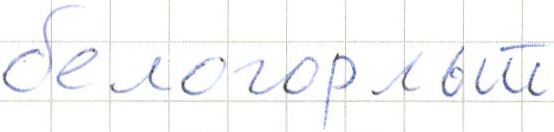белогорлый
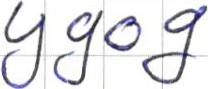удод
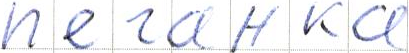пеганка
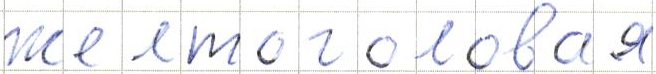желтоголовая
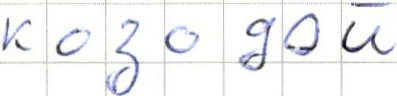козодой
